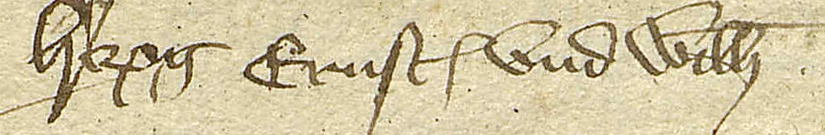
h*cʒog Ernſt* vnd Wilh*
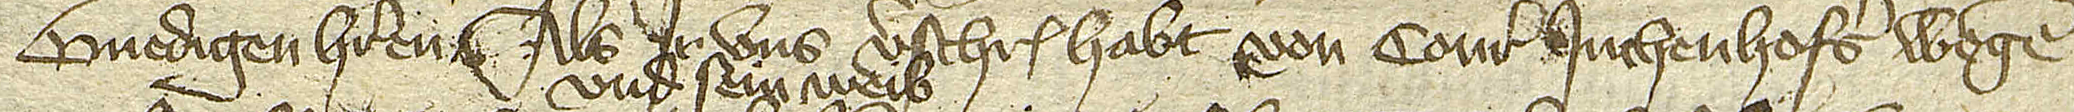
Gnedigen hr*en / Als Ir vns v*ſchr* habt von Conr* Iuchenhofs* wege*
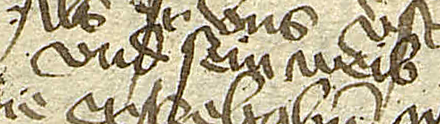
vnd ſein weib
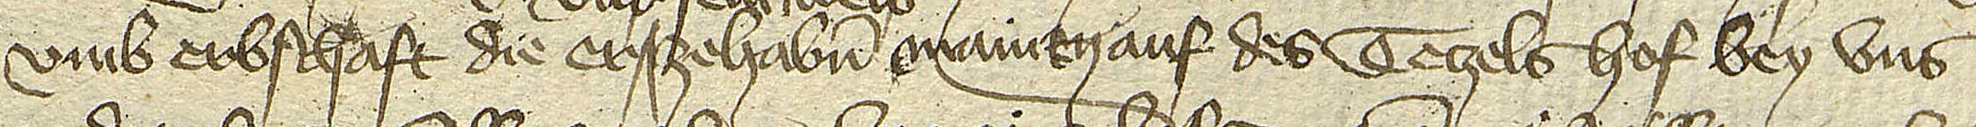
vmb erbſchaft die er cʒehabn* mainen auf des Tecʒels hof bey vns
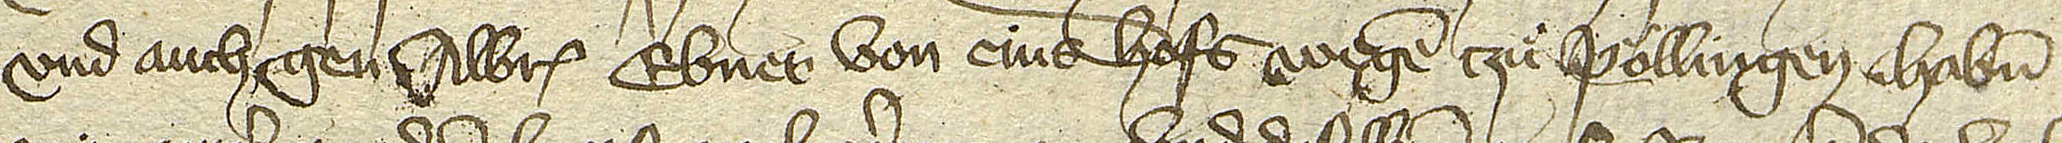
vnd auch gen Albr* Ebner von eins hofs wege* cʒü Pöllingen / habn*
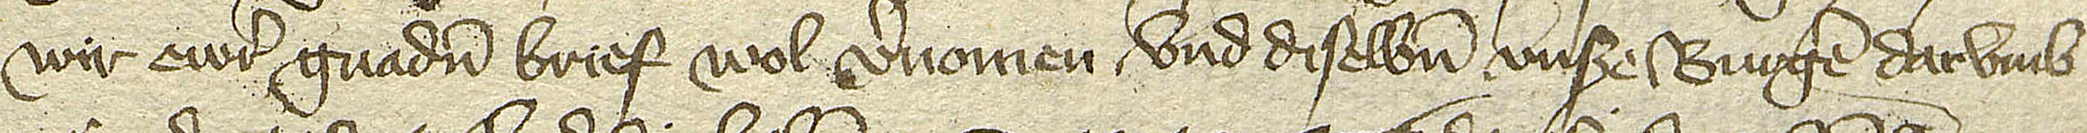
wir ewr* gnadn* brief wol v*nomen / vnd diſelbn* vnſ*e Burge* darvmb
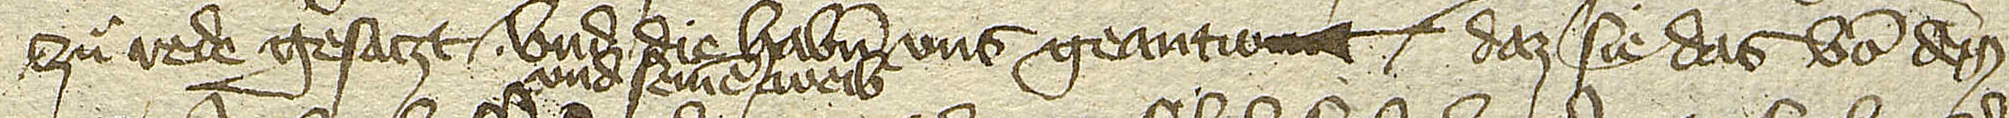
cʒü rede geſacʒt / . vnd die habn* vns geantwurt / daʒ ſie das vo* dem
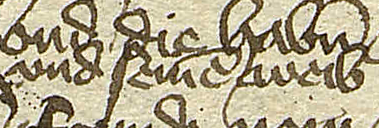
vnd ſeine* weib
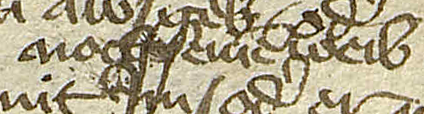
noch ſeine* weib
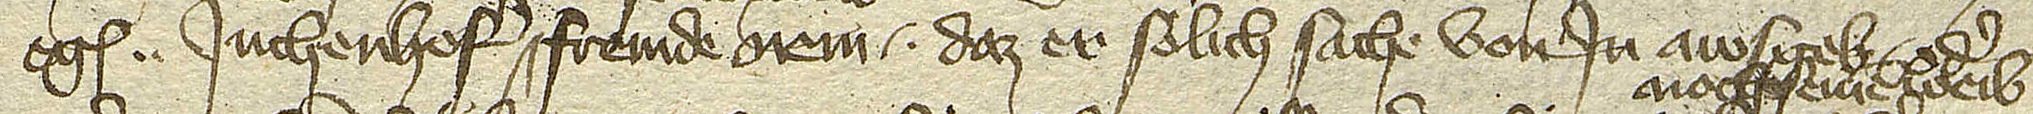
eg* ~ Iuchenhof* fremde nem / . daʒ er ſölich ſache von In awſgeb od*
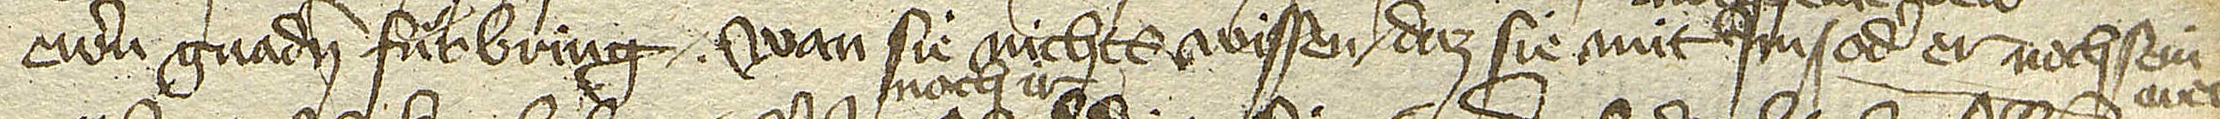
ew*n gnadn* fürbring / . wan ſie nichts wiſſen / daʒ ſie mit Im od* er noch ſein
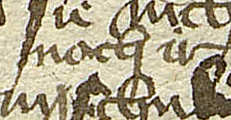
noch ir
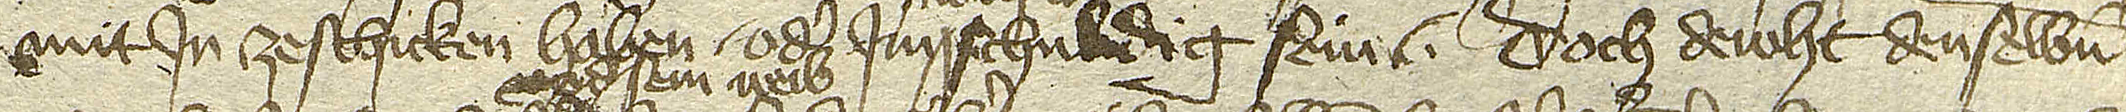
mit In cʒeſchicken haben / od* Im ſchuldig ſein / . Doch dewht denſelbn*
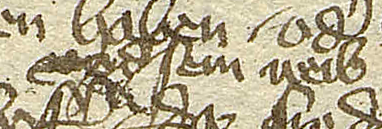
vnd ſein weib
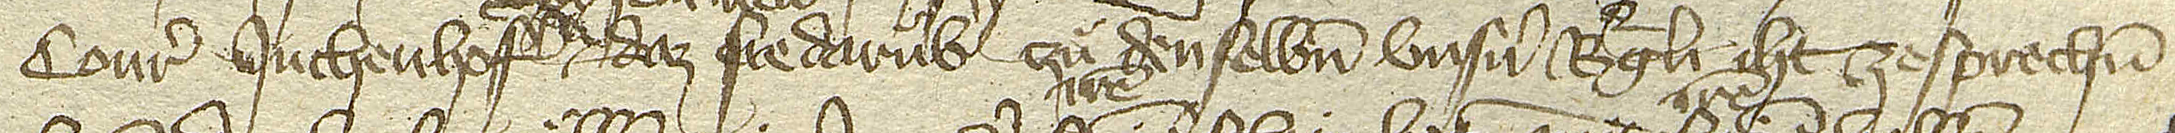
Conr* Iuchenhof* / daʒ ſie darüb* cʒu denſelbn* vnſn* B*g*n iht cʒeſprechn*
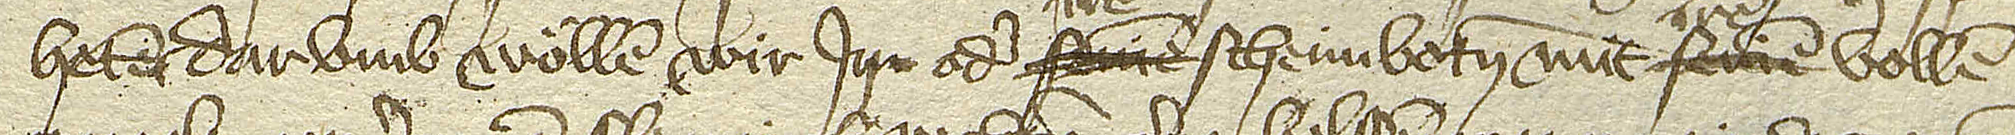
hete* darvmb wölle* wir In od* ſeine* ſcheimbotn* mit ſeine* volle*
